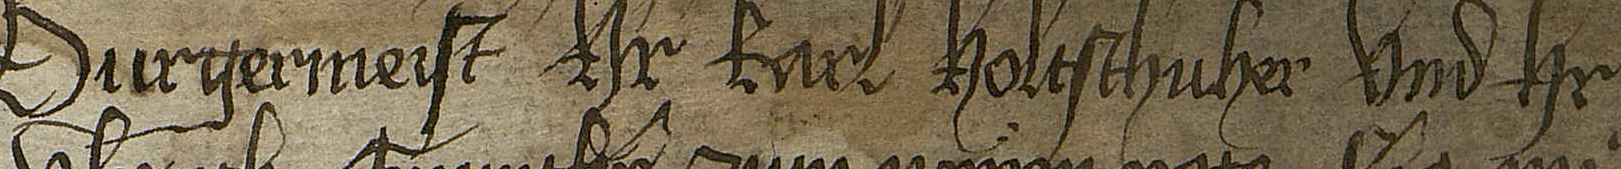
Burgermeiſt* Hr* Karl Holtſchuher Vnd Hr*
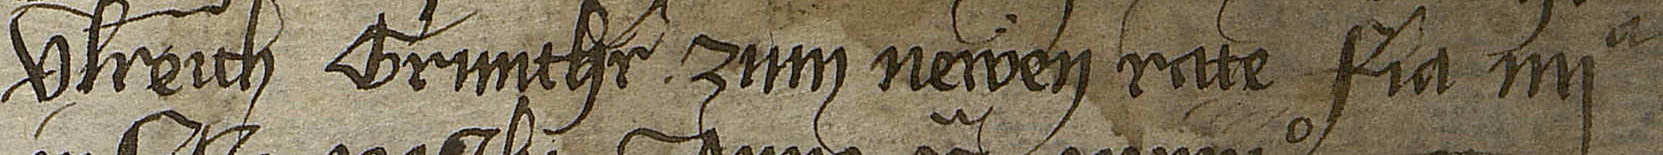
Vlreich Grunthr* ʒum newen rate fi*a iiii*
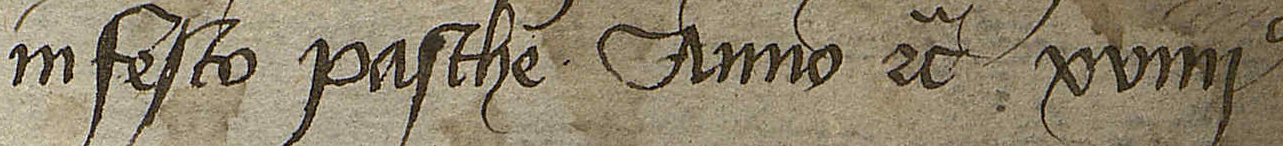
in feſto paſche . Anno ec* xviiii*
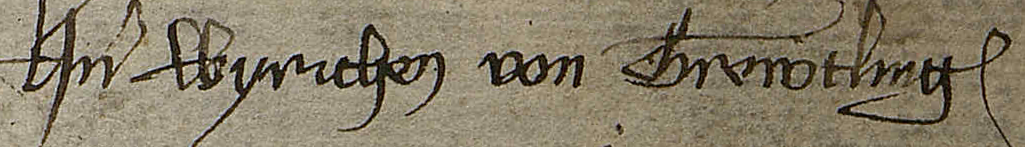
Hn* Wyrichen von Trewtling*
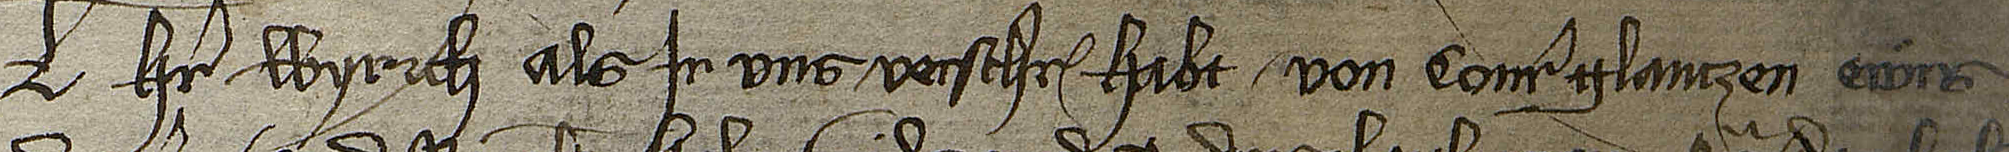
L* hr* Wyrich als Ir vns verſchr* habt / von Conr* glancʒen ewrs
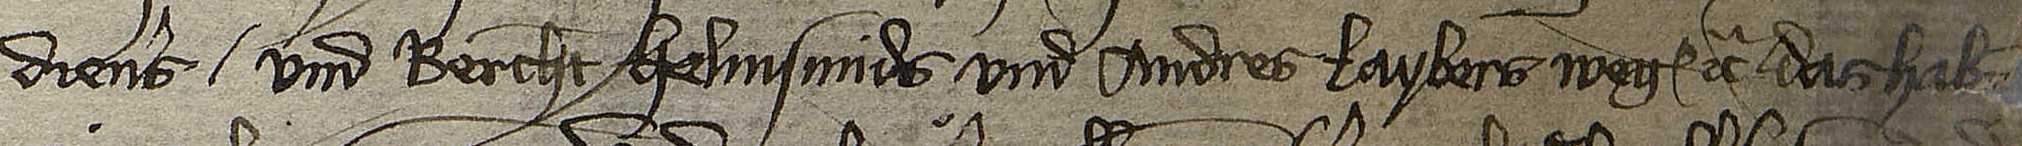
dien*s / vnd Bercht* Helmſmids vnd Andres Laybers weg* ec* / das habn*
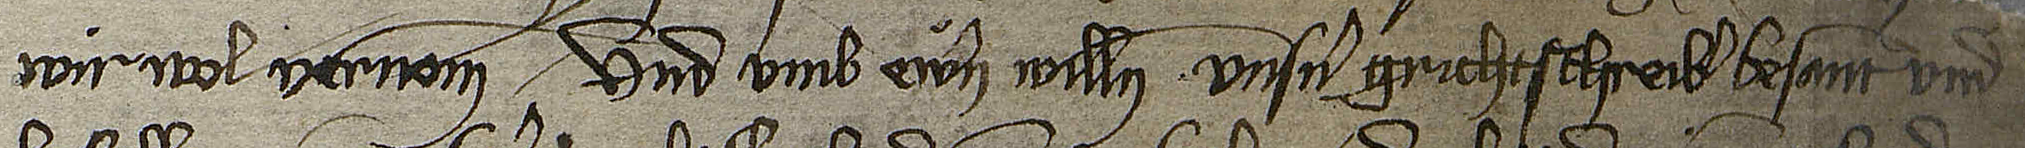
wir wol vernom* / Vnd vmb ew*n willn* . vnſn* grichtſchreib* beſant vnd
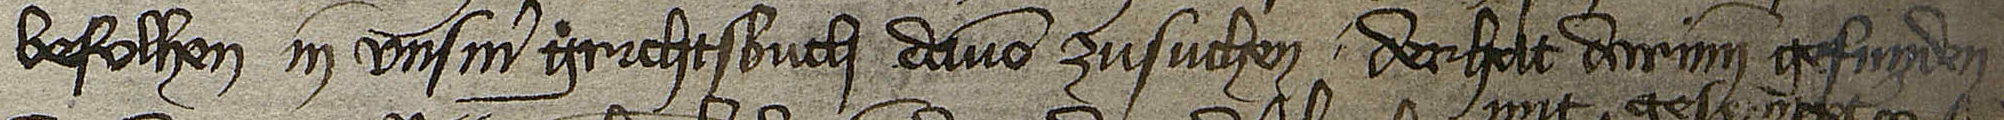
befolhen in vnſm* grichtſbuch dauo* ʒuſuchen / der hat darinn* gefunden
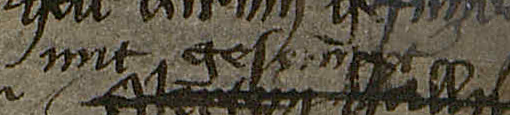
mit geſampt*
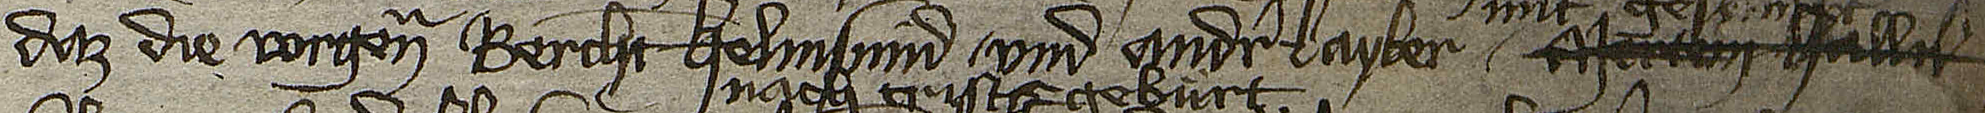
daʒ die vorgen* Bercht* Helmſmid / vnd andr* layber / Mertein Halln*
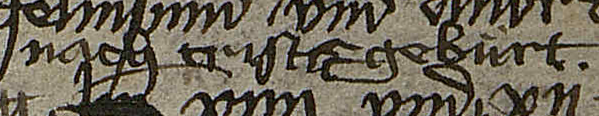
nach Criſts gebürt
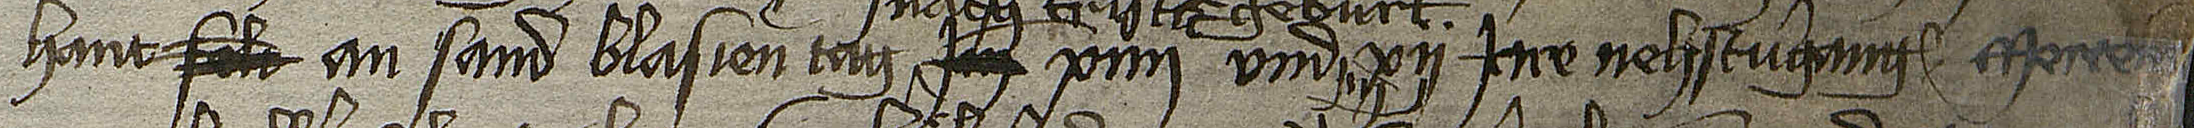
hant ſolt an ſand blaſien tag Im xiiii vnd vnd xii Iare nehſtu*gang* Mertein
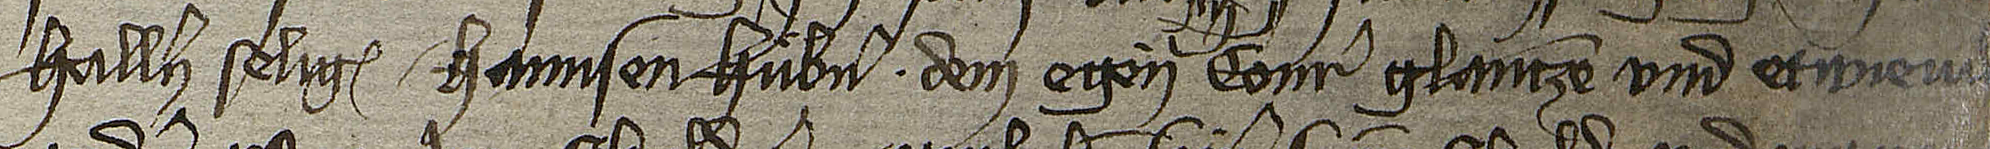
Halln* ſelig* / Hannſen Hübn* . dem egen* Conr* glancʒe* vnd etwieuil
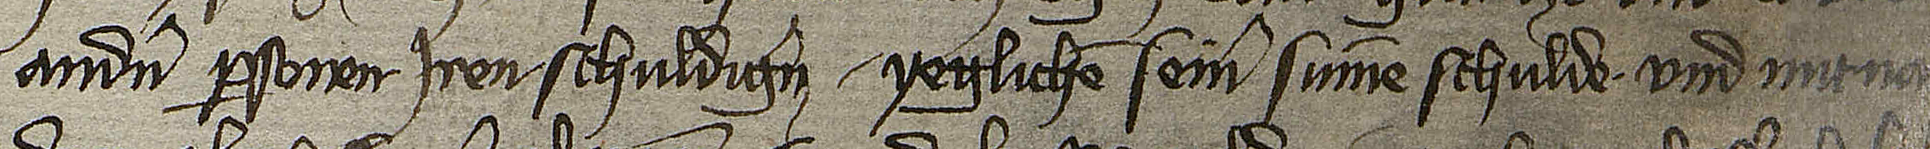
andn* p*ſonen Iren ſchuldig*n / yegliche* ſein* ſume* ſchulde . vnd mitna
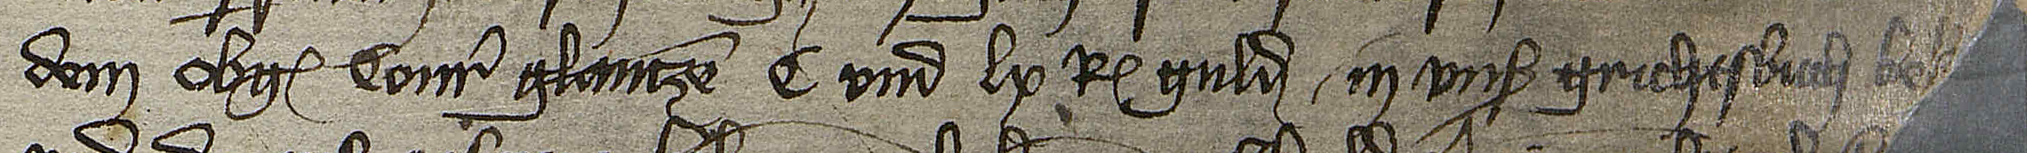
dem obg* Conr* glancʒe* C vnd lx R* guld* / in vnſ* grichtſbuch be
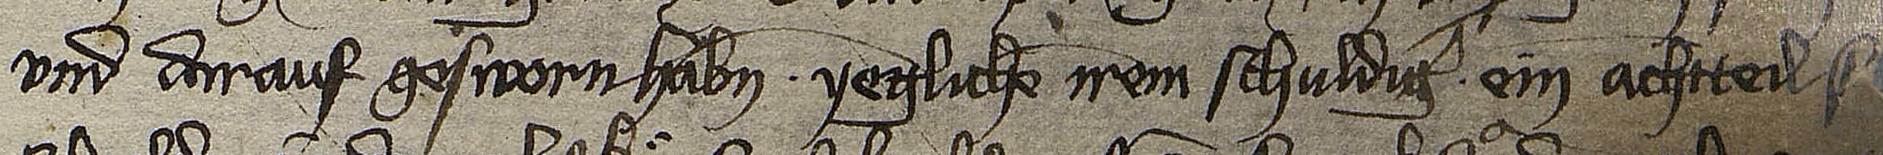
vnd darauf geſworen habn* . yegliche* irem ſchuldig* . ein* achtteil ſ
